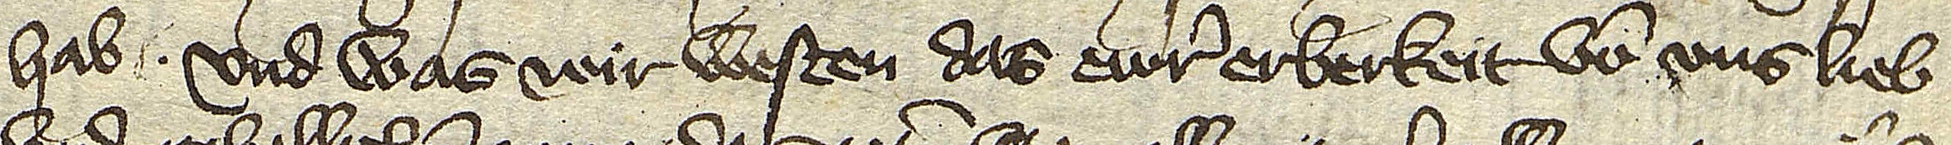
hab / . vnd was wir weſten das ewr* erberkeit vo* vns lieb
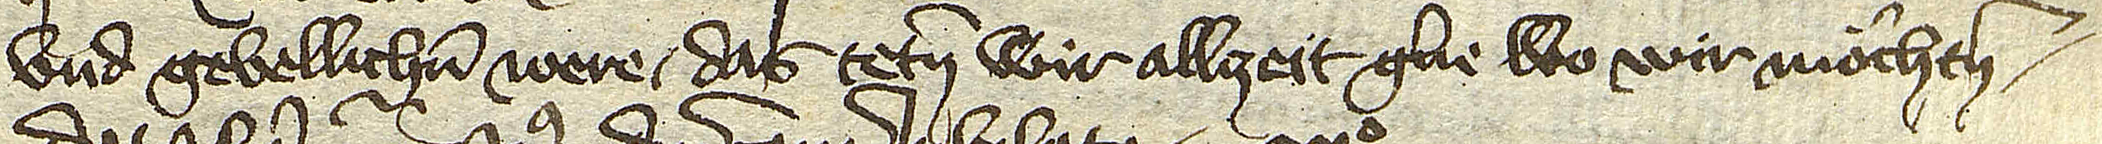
vnd gevellichn* were / das tetn* wir allcʒeit g*ne wo wir möchtn* /
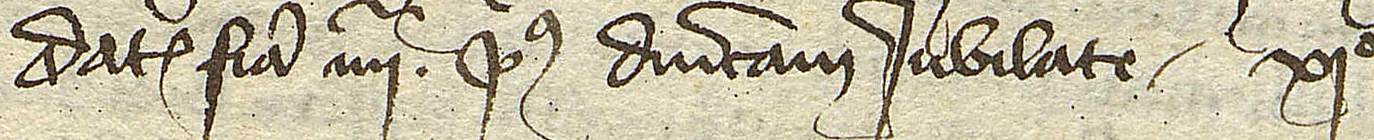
Dat* fia* iiii* . p* dnicam* Iubilate / xi*
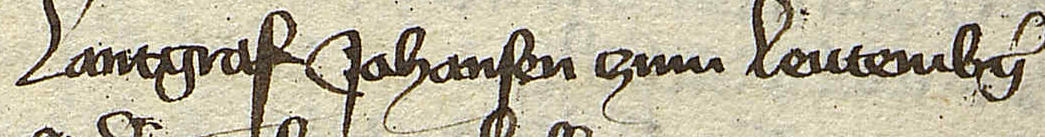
Lantgraf Iohanſen cʒum leutembg*
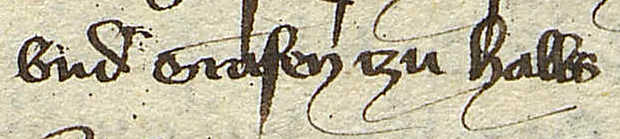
vnd Grafen cʒu halls
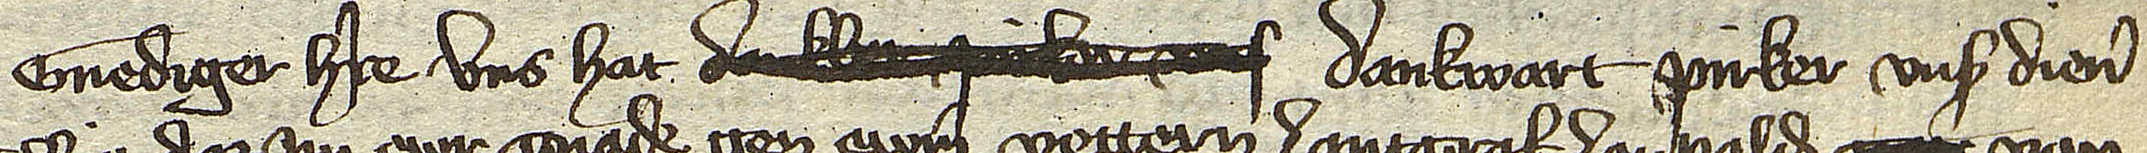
Gnediger h*re / vns hat dankler pirker vnſ dankwart pirker vnſ* dien*
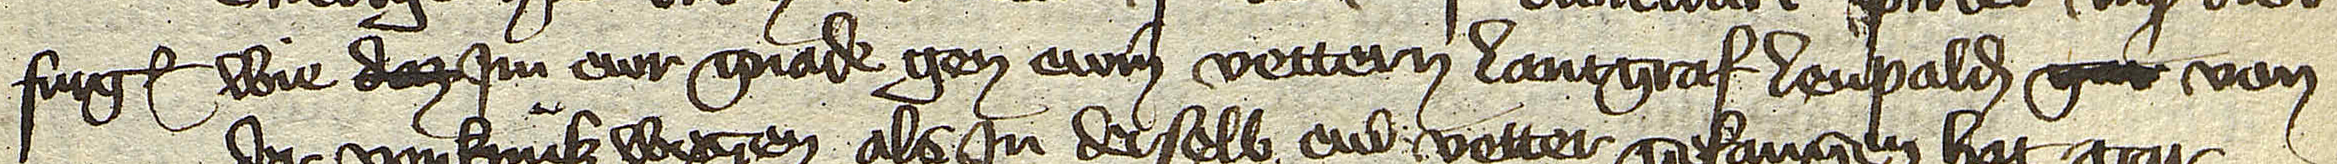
furg* wie daʒ Im ewr gnade gen ewm* vettern lantgraf Leupold* gen von
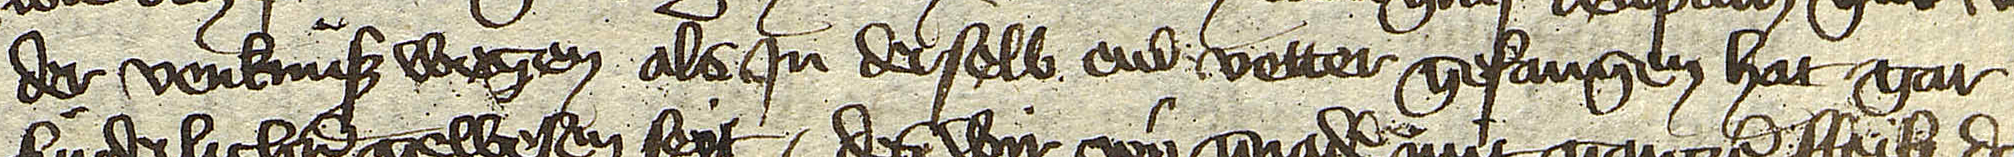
der venknüſʒ wegen als In derſelb ew* vetter gefangen hat / gar
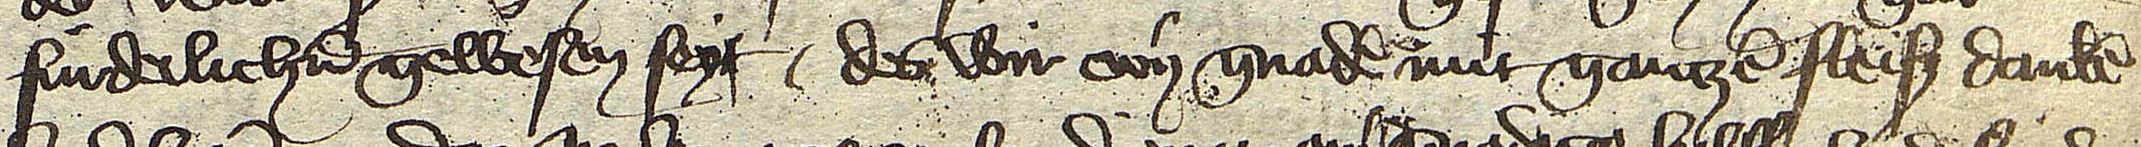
fürderlichn* geweſen ſeyt / das wir ewn* gnade* mit gancʒe* fleiſʒ danke*
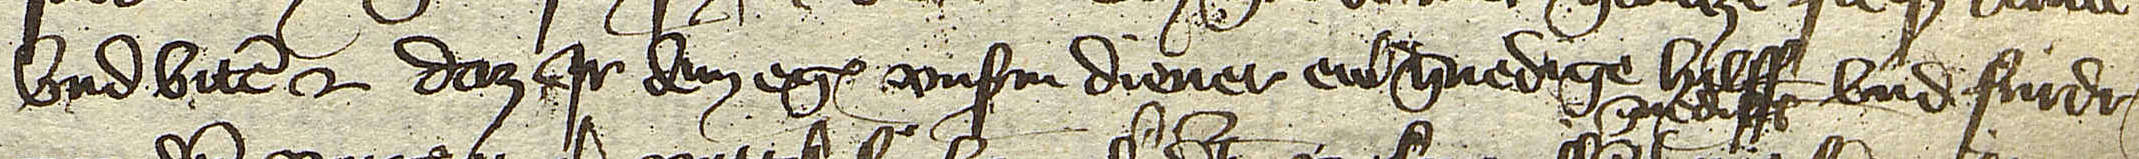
vnd bite* ec* daʒ Ir dem eg* vnſ*m diener ew* gnedige hilff vnd fürdr*
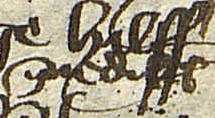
gnedikl*
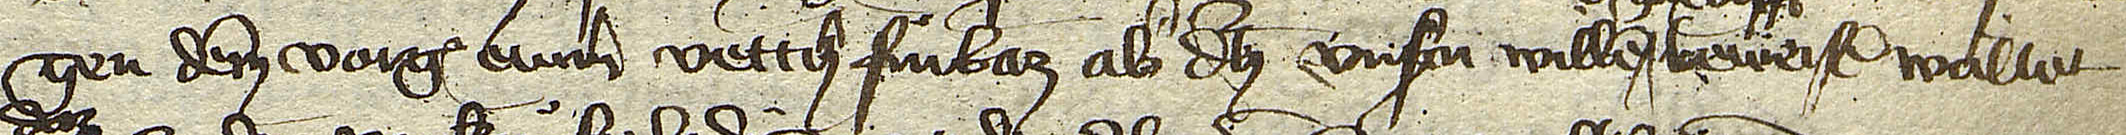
gen dem* vorg* ewm* vettn* fürbaʒ ab* d*h vnſ*n wille* beweiſe* wöllet
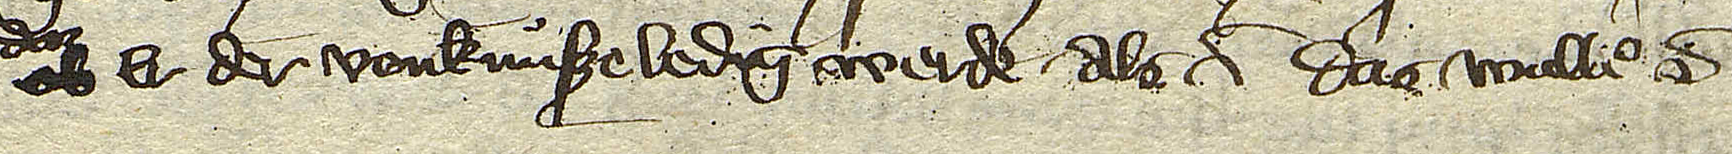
ob Er der venknüſʒe ledig werde / Als ec* das wolle* ec*
